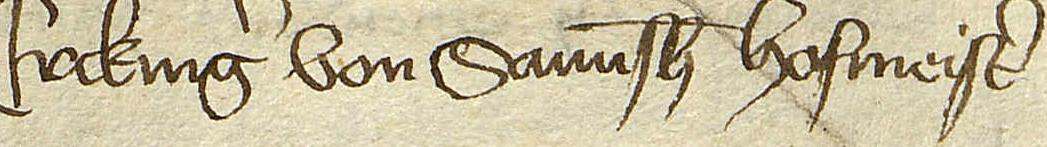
Ercking* von Saunſh* Hofmeiſt*
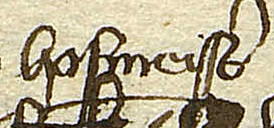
hofmeiſt*
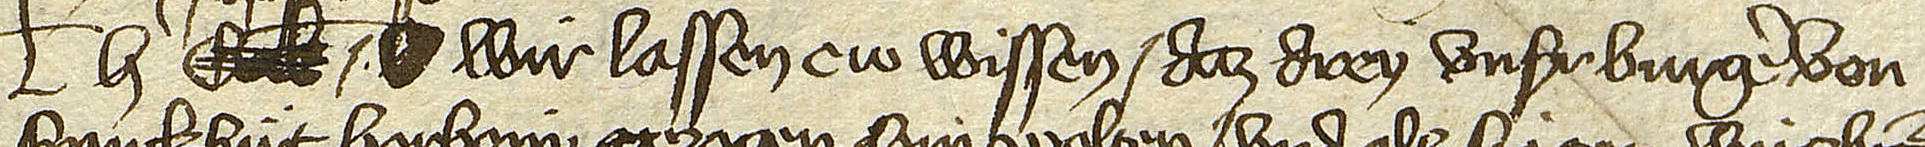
L* h* Erck /. % Wir laſſen ew wiſſen / daʒ drey vnſ*r burge* von
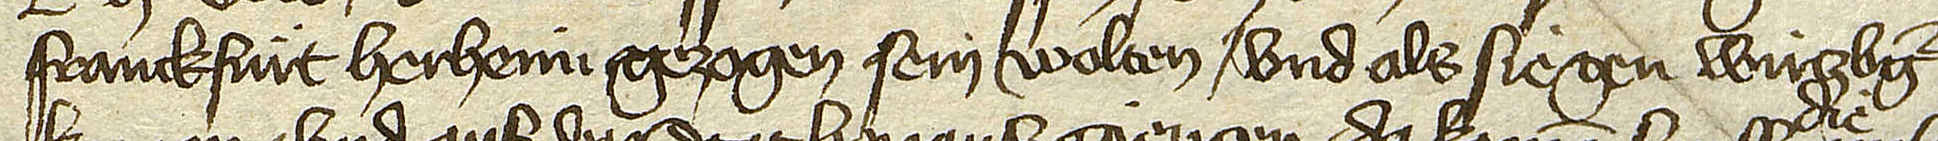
franckfürt herheim geʒogen ſein wolten / vnd als ſie gen wircʒb*g
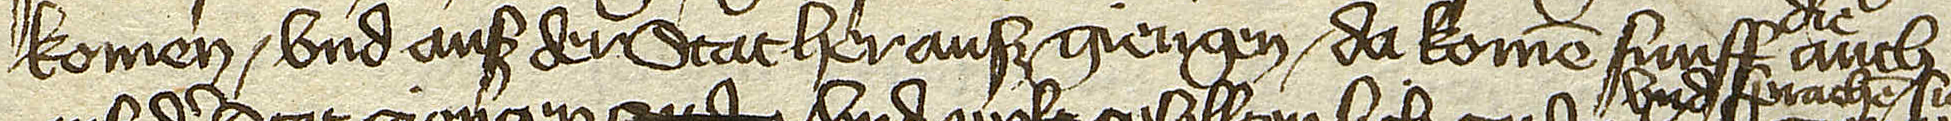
komen / vnd auſʒ der Stat herauſʒ giengen / da kome* funff auch
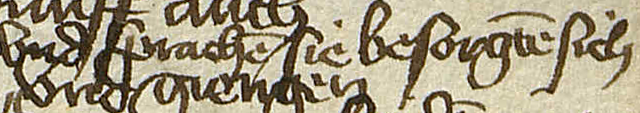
vnd ſprache* / ſie beſorgte* ſich
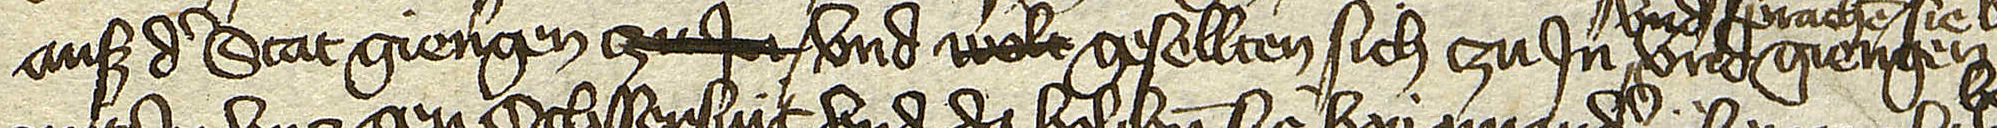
auſʒ d* Stat giengen cʒu In / vnd wolt geſellten ſich cʒu In vnd giengen
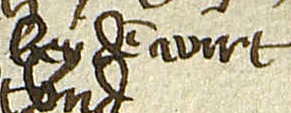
bey d* wirt
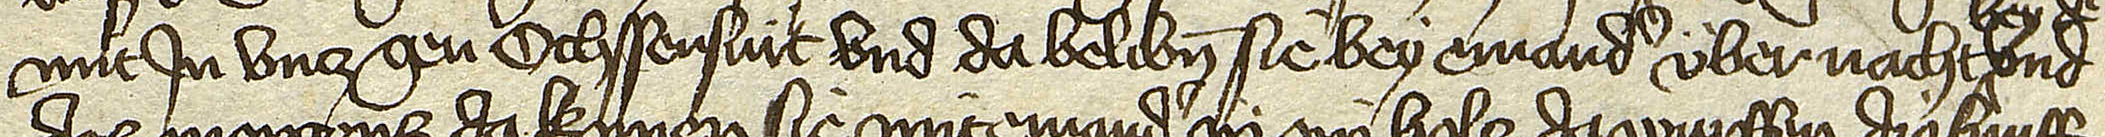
mit In vncʒ gen Ochſſenfürt vnd da belibn* ſie bey einand* v̈ber nacht vnd
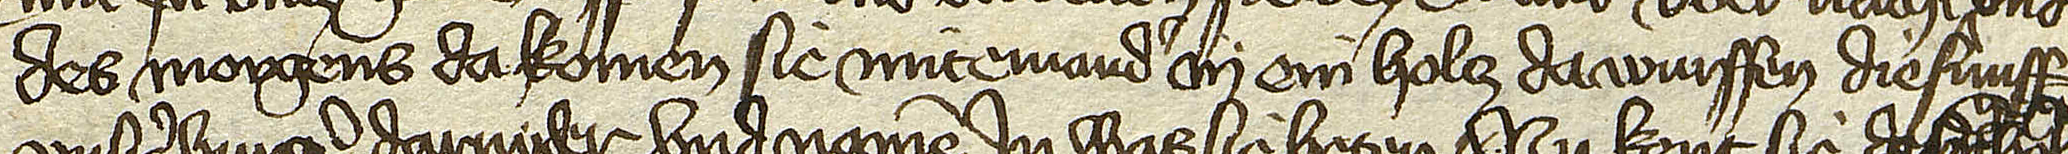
des morgens da komen ſie miteinand* in ein holcʒ da wurffen die fünff
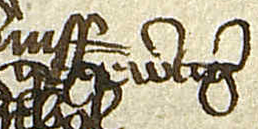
gege*w*tig*
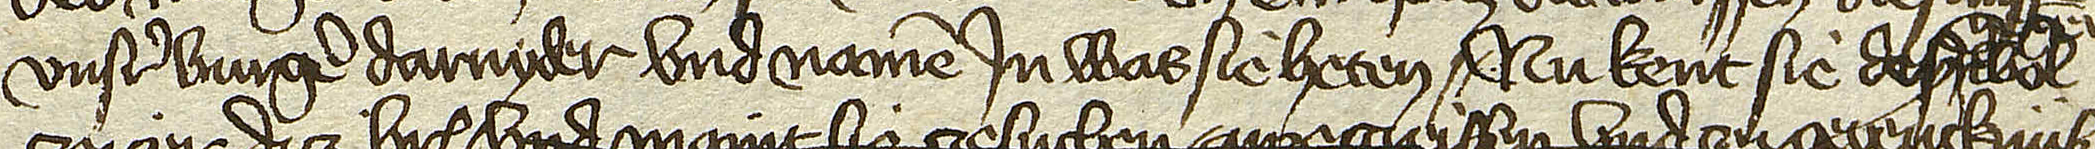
vnſr* burge* darnyder vnd name* In was ſie heten / Nu kent ſie deſ* wol
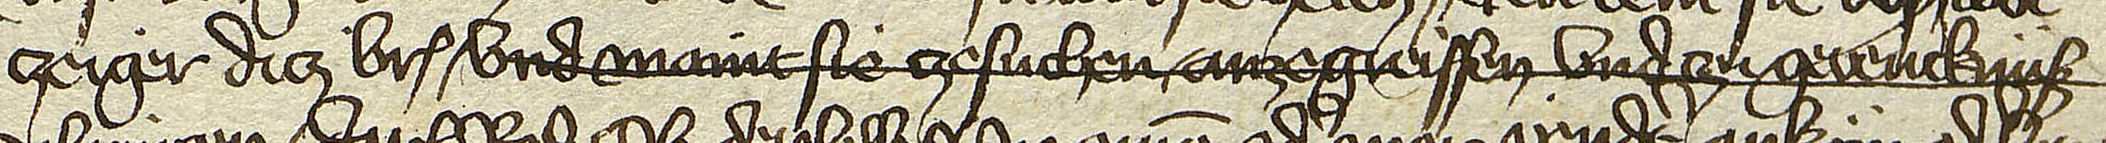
cʒeiger dicʒ br* / vnd maint ſie cʒeſuchen / ancʒegreiffen vnd cʒu gevencknüſʒ
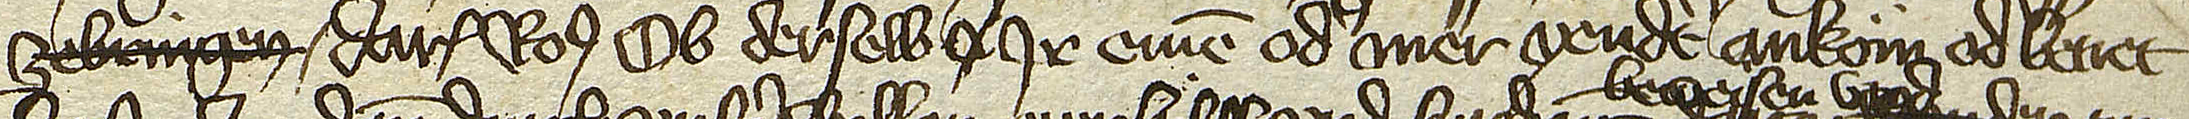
cʒebringen / Dar* Ro* Ob derſelb o Ir eine* od* mer yendt* anköm od* betret
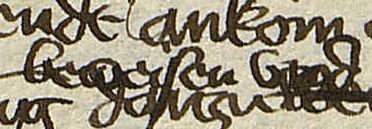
begreifen vnd
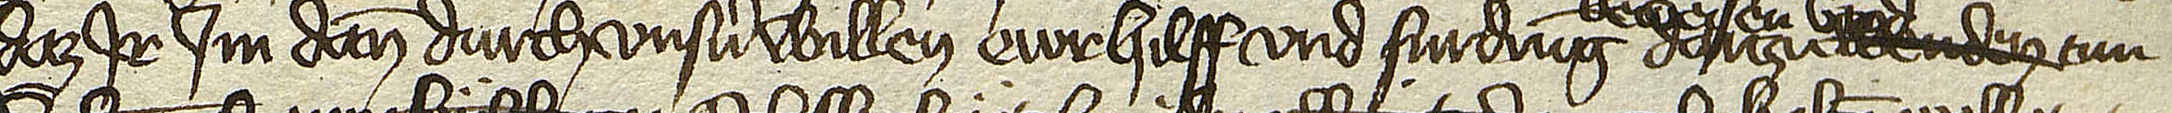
daʒ Ir Im dan* durch vnſn* willen ewr hilff vnd furdrug* darcʒu wenden tun
